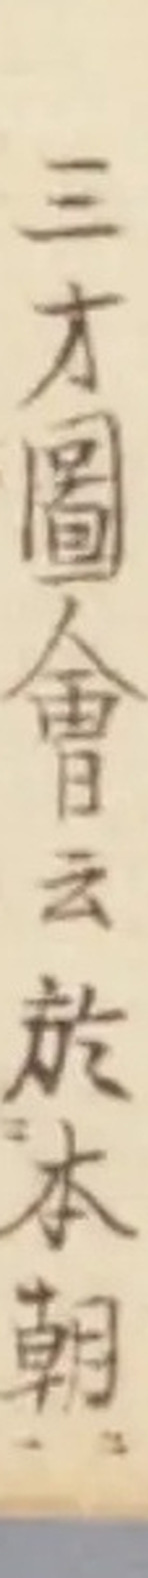三才図絵云於本朝
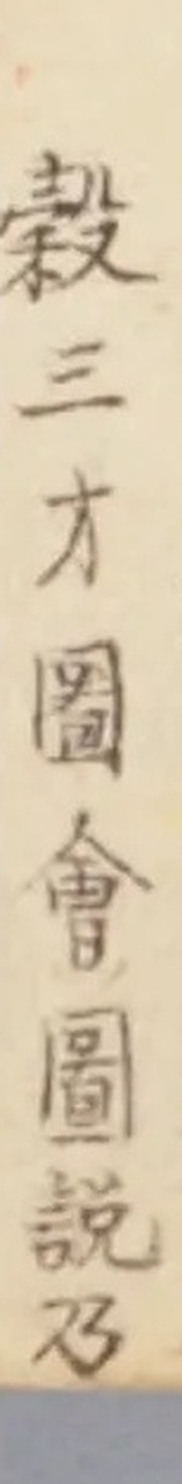殻三才図会ノ図説乃
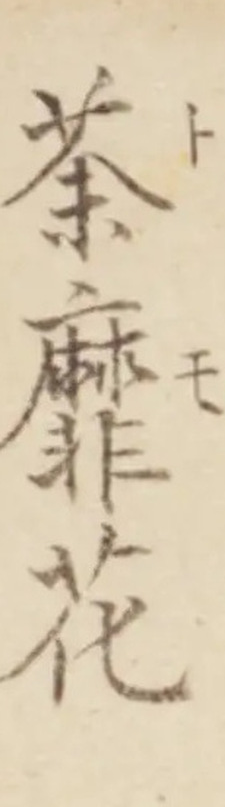荼靡花
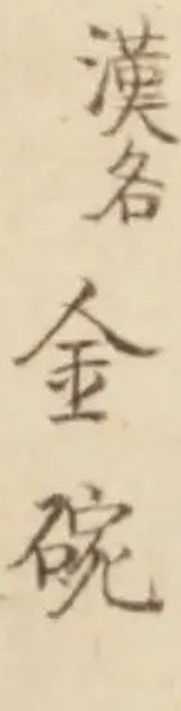漢名金碗
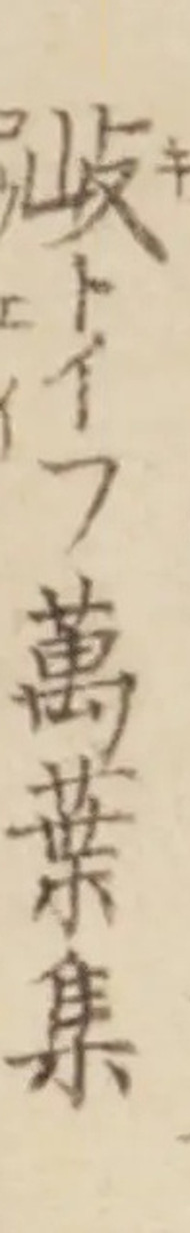岐トイフ万葉集
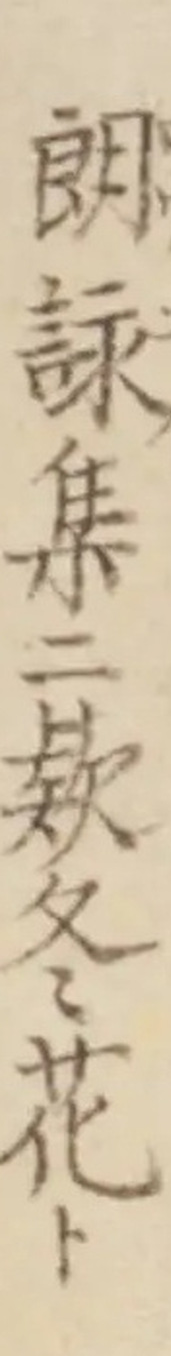朗詠集に欵冬花ト
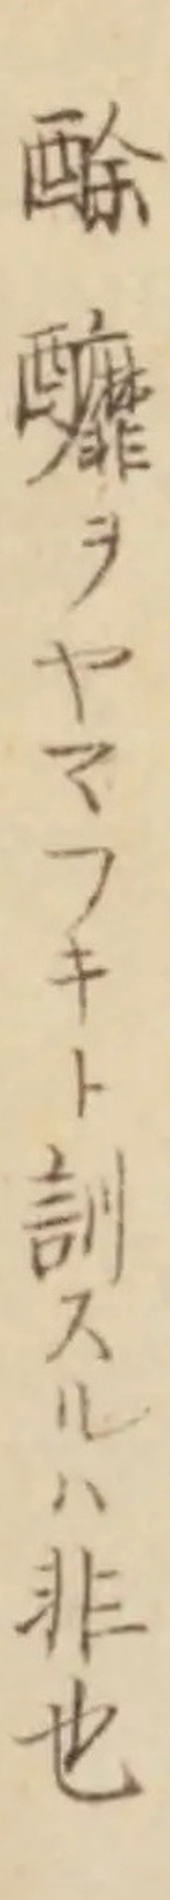酴醿ヲヤマフキト訓スルハ非也
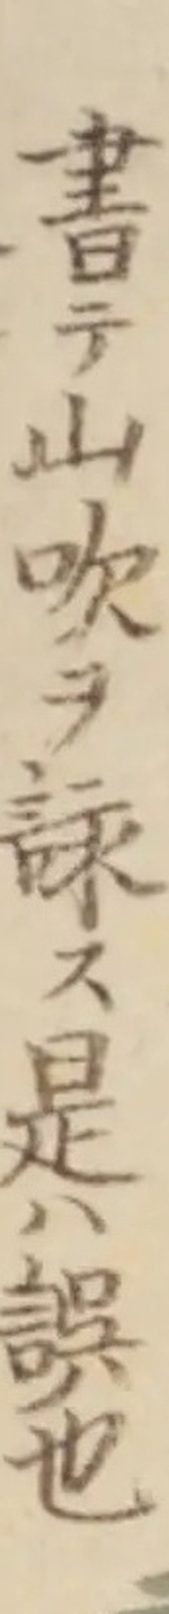書テ山吹ヲ詠ス是ハ誤也
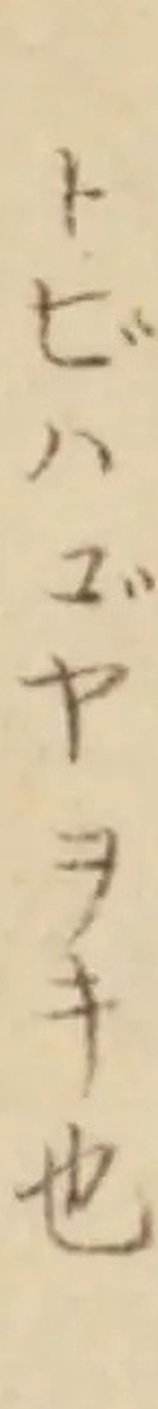トビハゴヤヲキ也

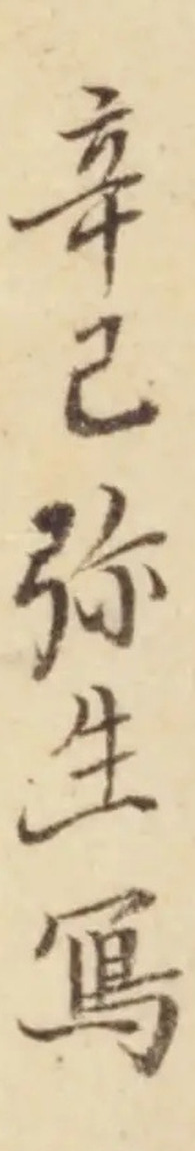辛巳弥生写
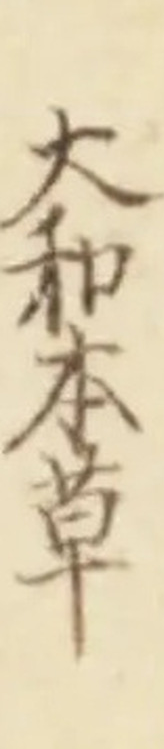大和本草
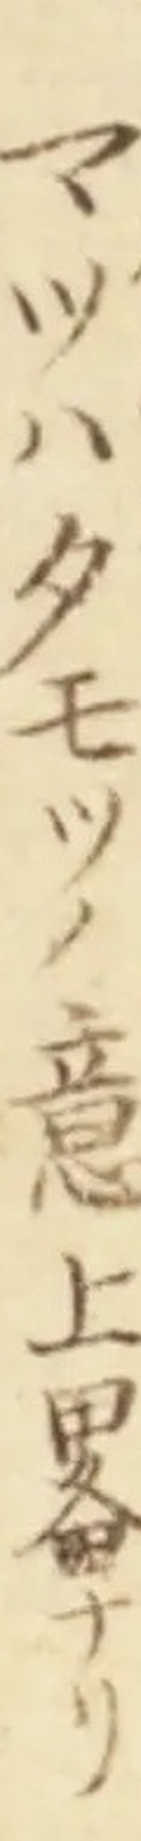マツハタモツノ意上略ナリ
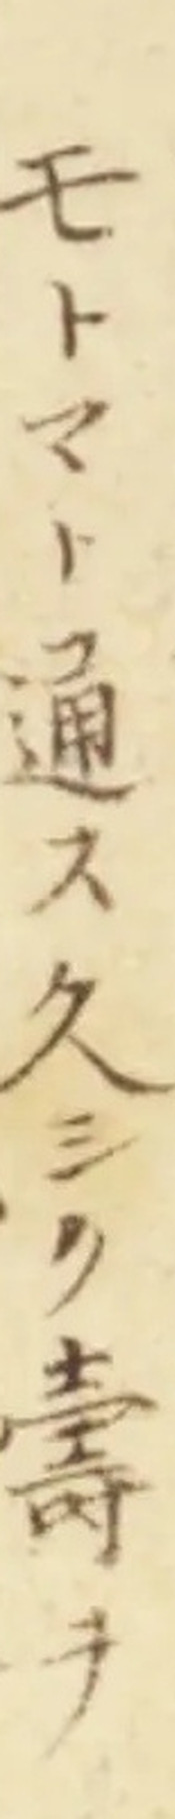モトマト通ス久シク寿ヲ
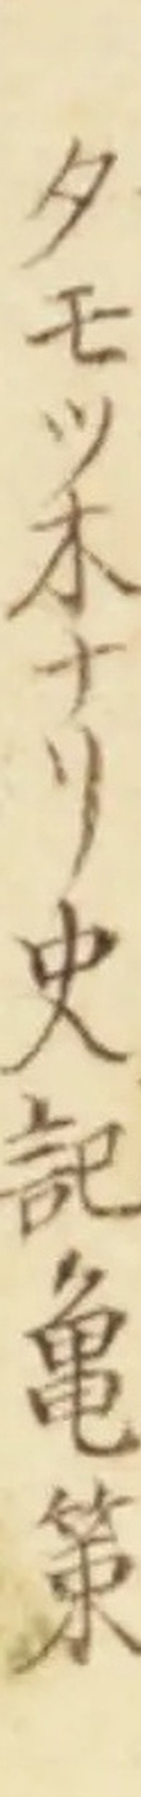タモツ木ナリ史記亀策
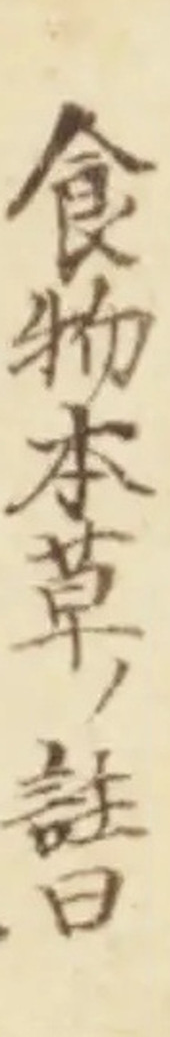食物本草註曰
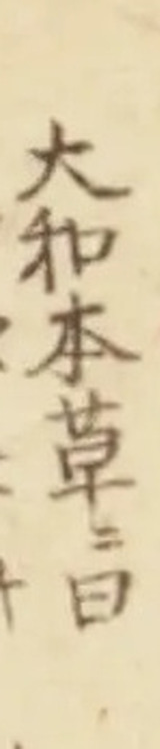大和本草曰
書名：梅園草木花譜春之部. 1
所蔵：国立国会図書館 National Diet Library, JAPAN
